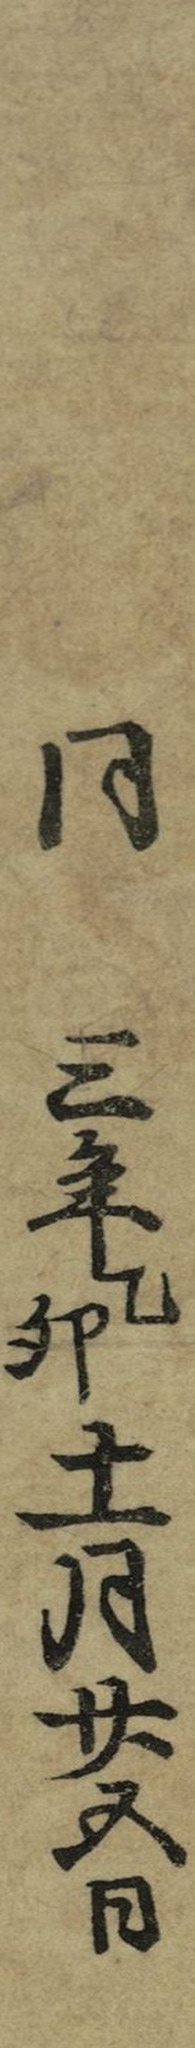同三年乙卯十一月廿五日
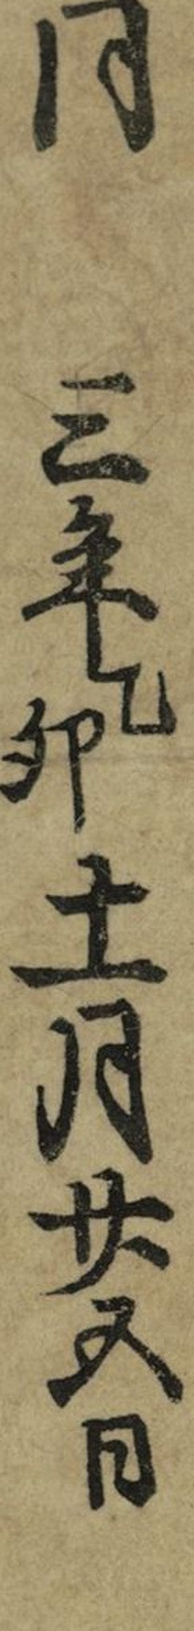同三年乙卯十一月廿五日
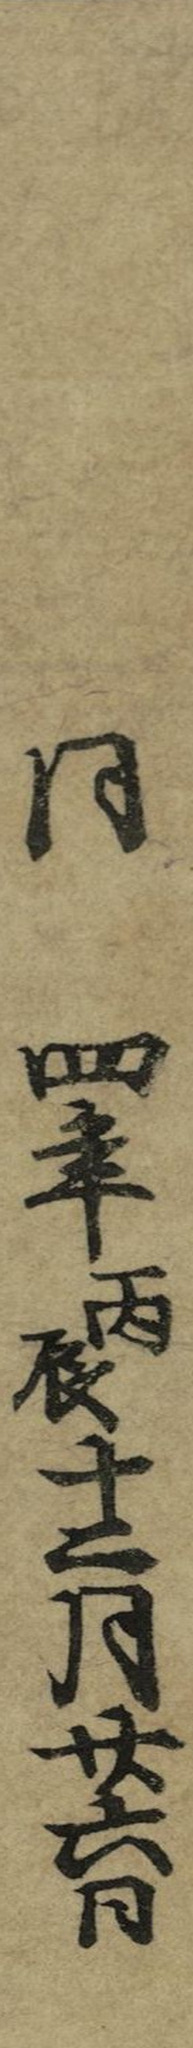同四年丙辰十二月廿六日東六条
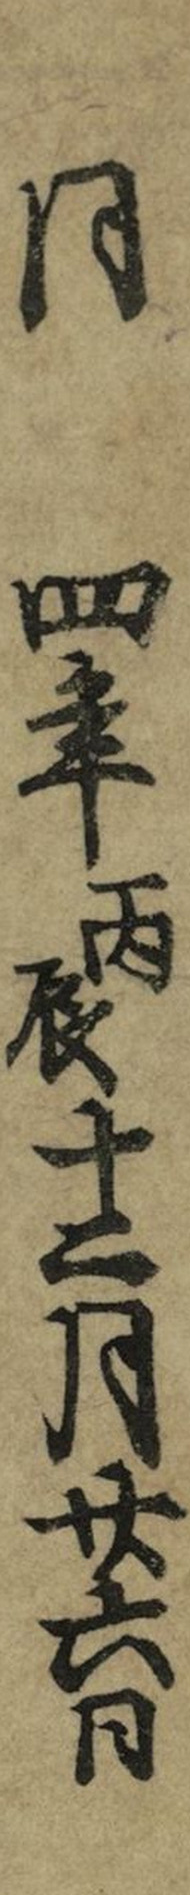同四年丙辰十二月廿六日東六条
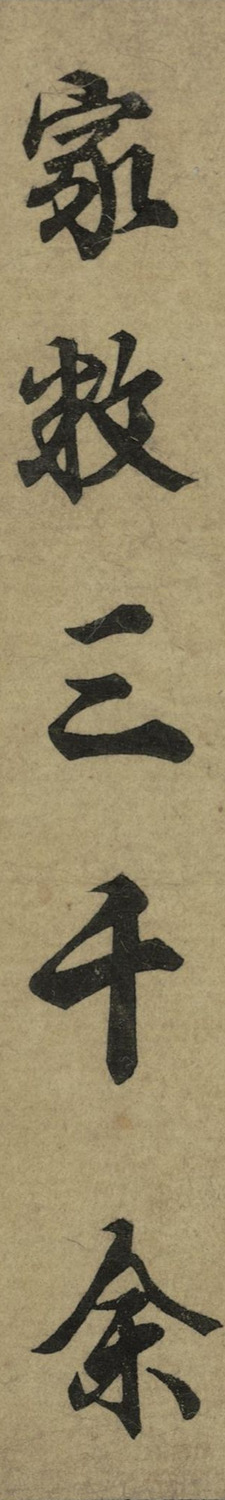家数三千余
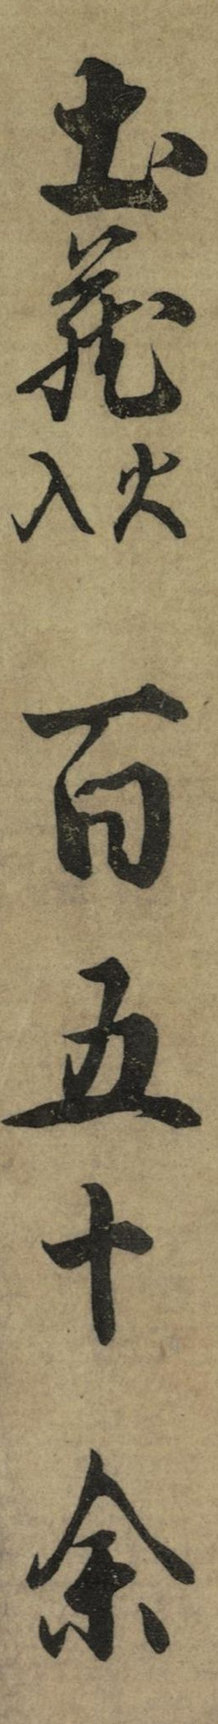土蔵火入百五十余
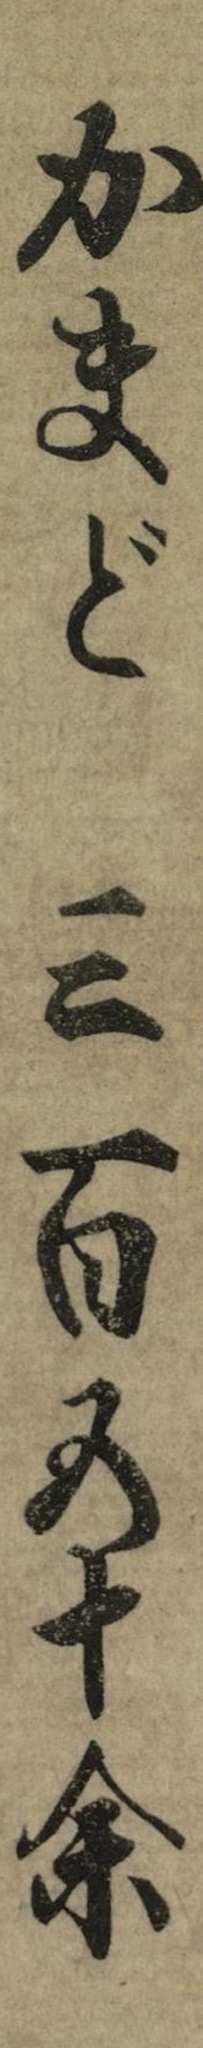かまど三百五十余
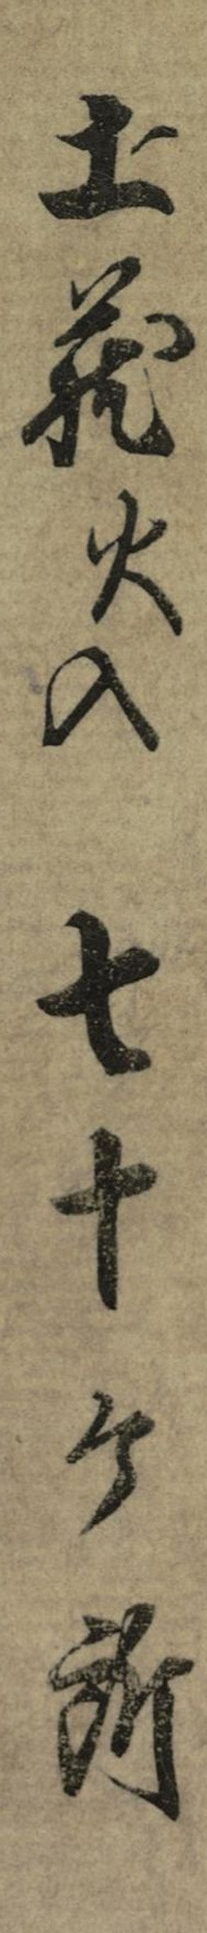土蔵火入七十ケ所
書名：京都近世大火畧圖
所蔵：東京大学地震研究所図書室 Earthquake Research Institute Library, The University of Tokyo, JAPAN
